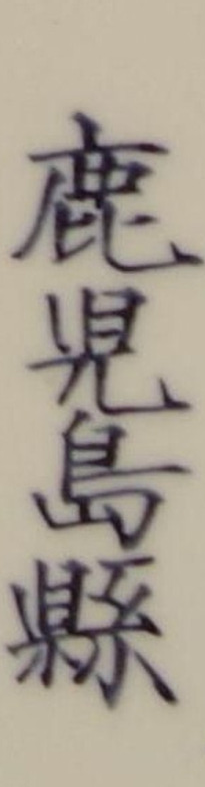＠鹿児島県
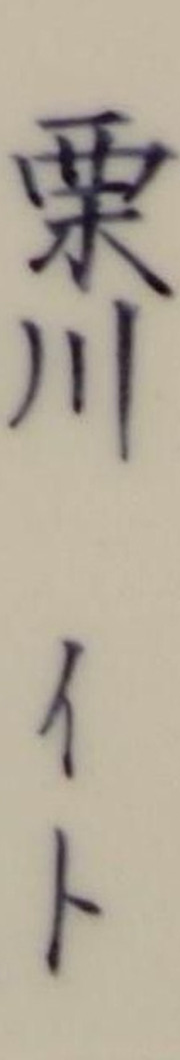栗川イト
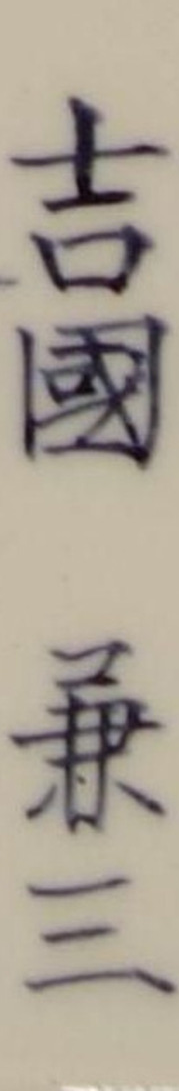吉国兼三
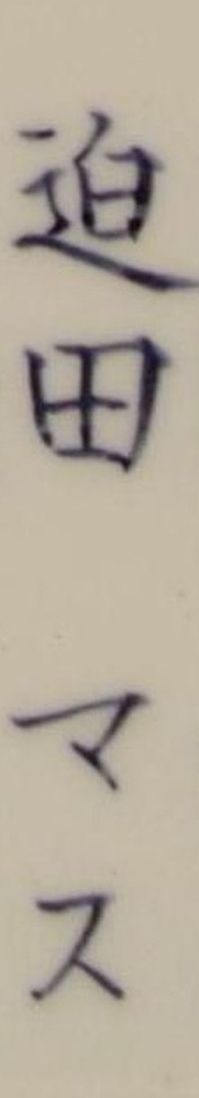迫田マス
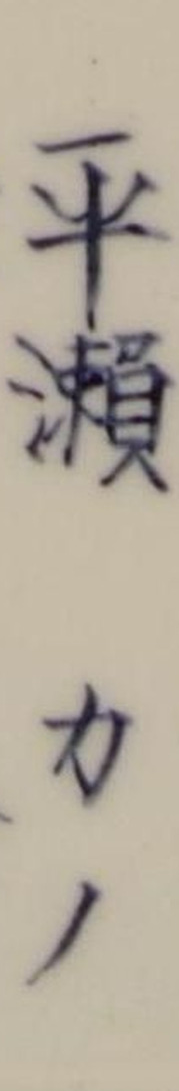平瀬カノ
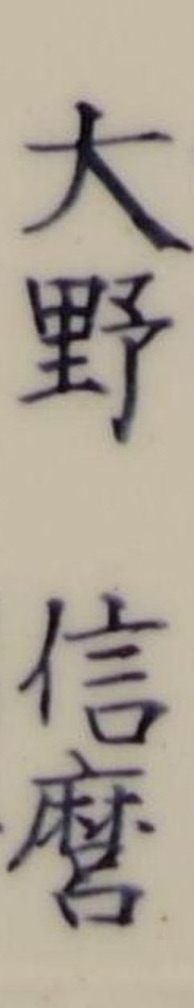大野信麿
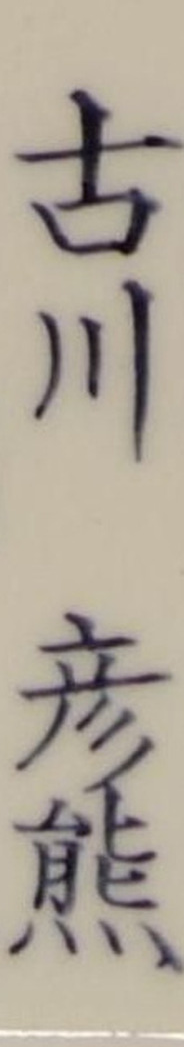古川彦熊
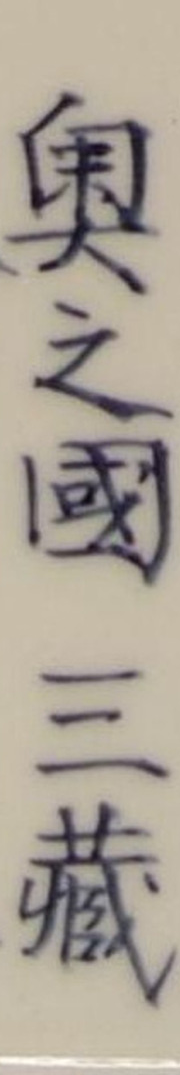奥之國三蔵
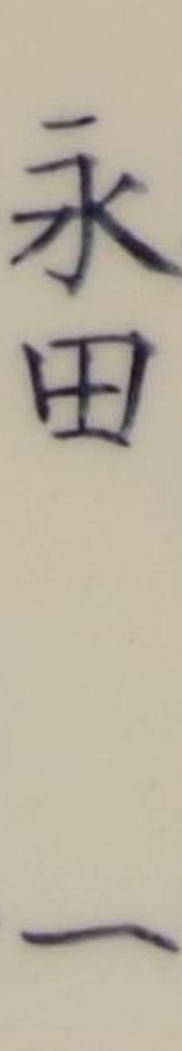永田一
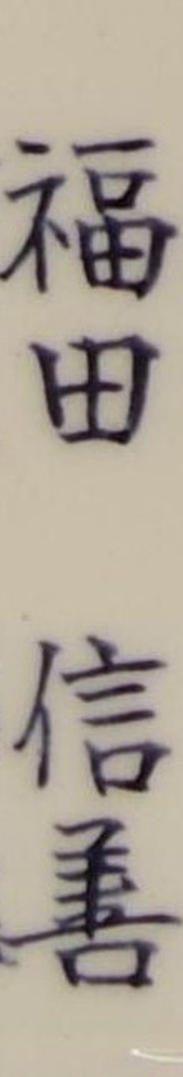福田信善
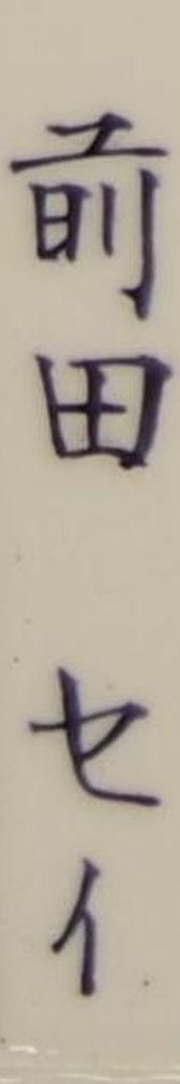前田セイ

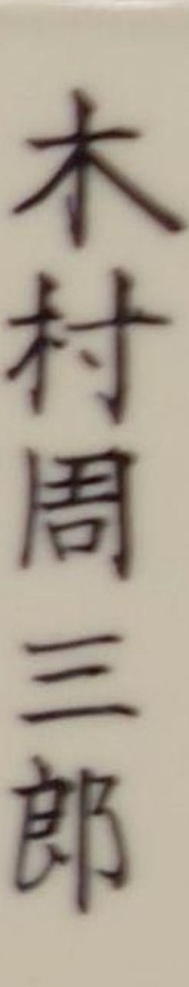木村周三郎
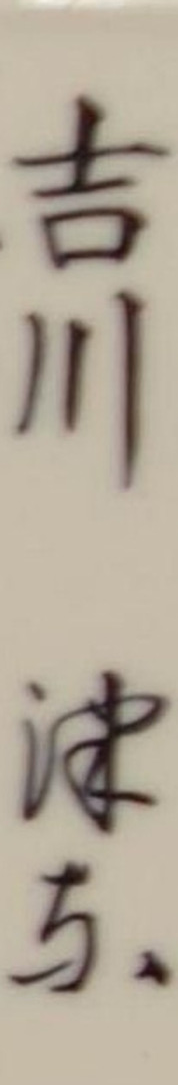吉川つな
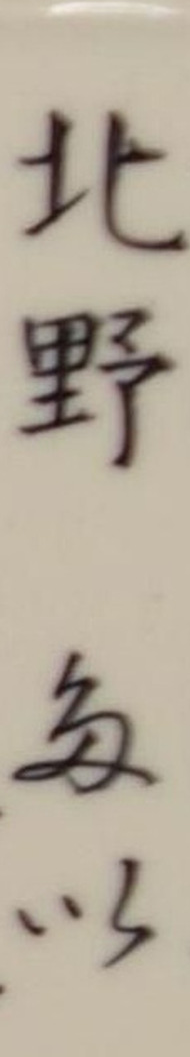北野たい
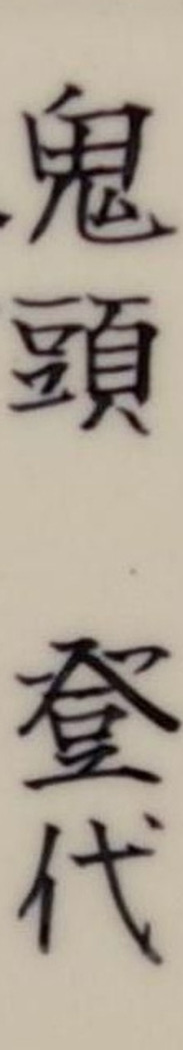鬼頭登代
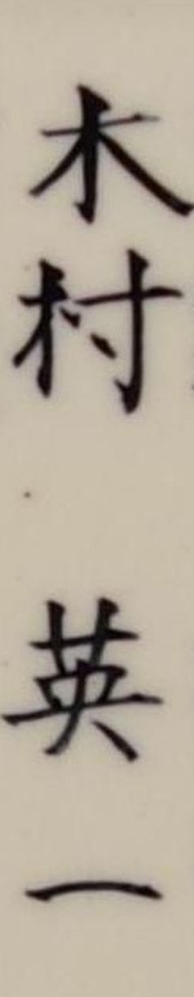木村英一
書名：M~S
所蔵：高野山金剛峯寺
